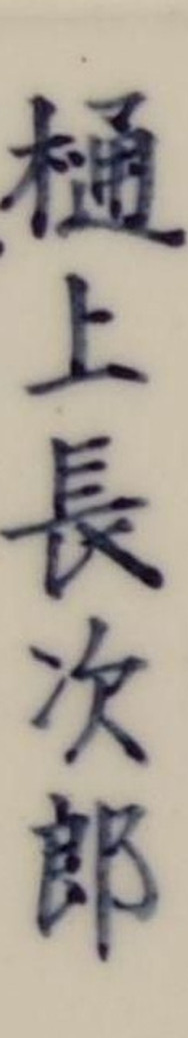樋上長次郎
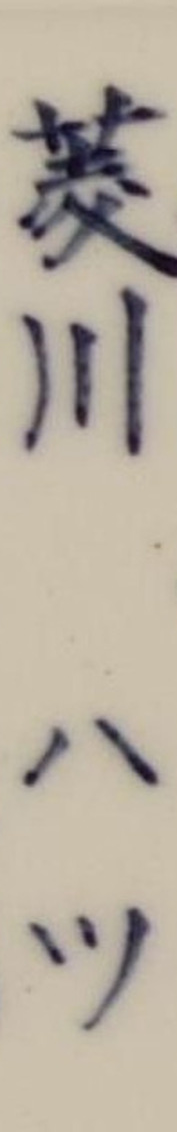菱川ハツ
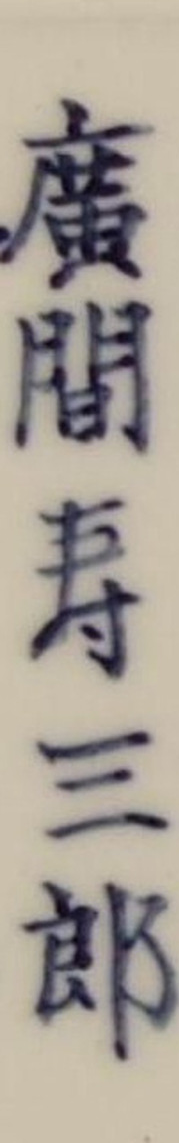廣間寿三郎
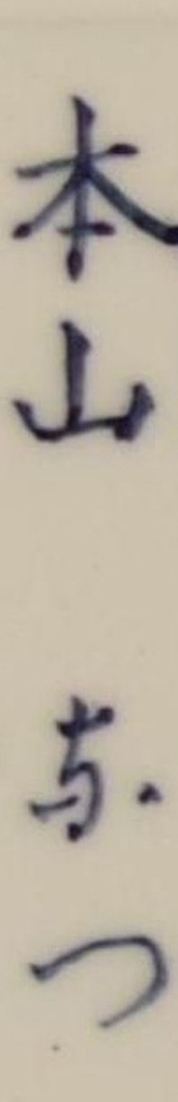本山なつ

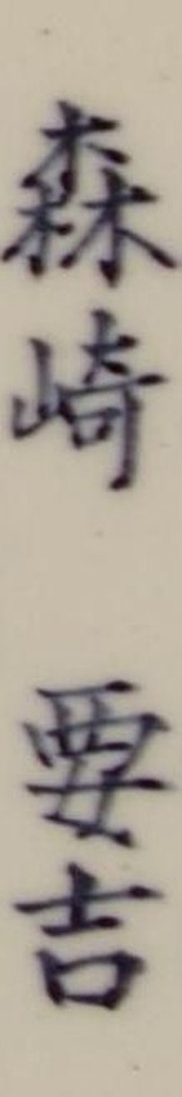森崎要吉
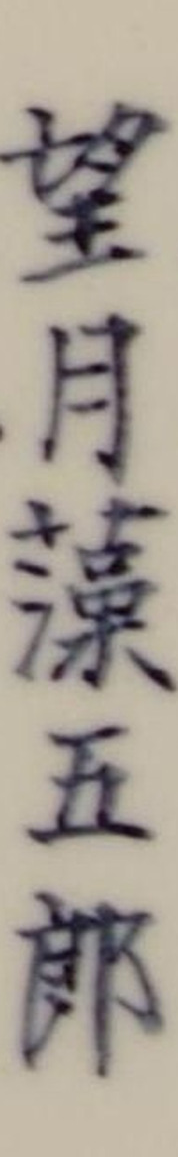望月藻五郎
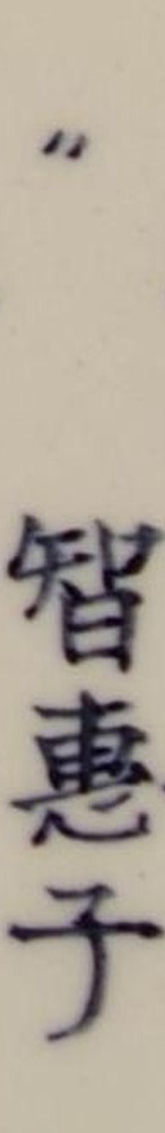智恵子
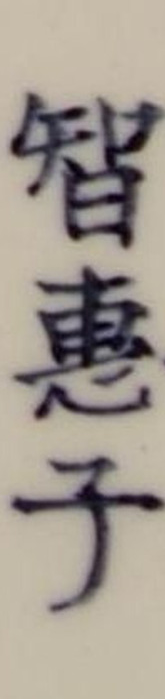智恵子
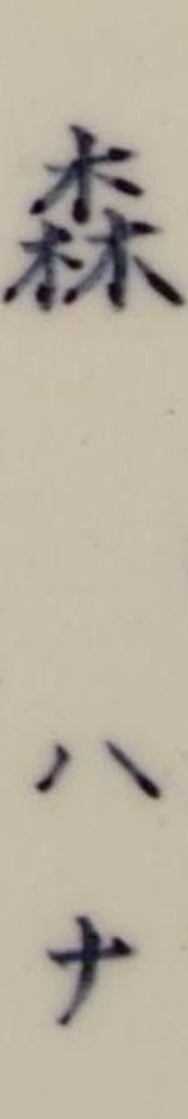森ハナ
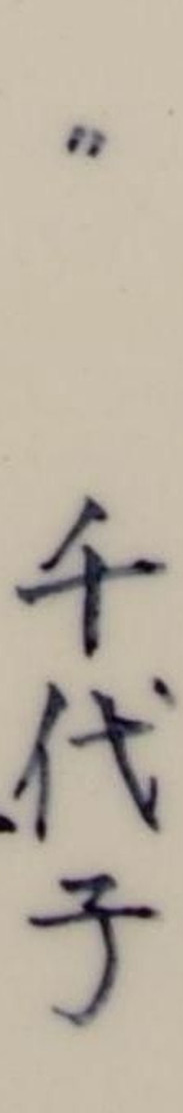千代子
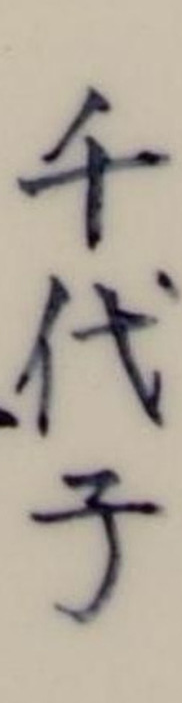千代子
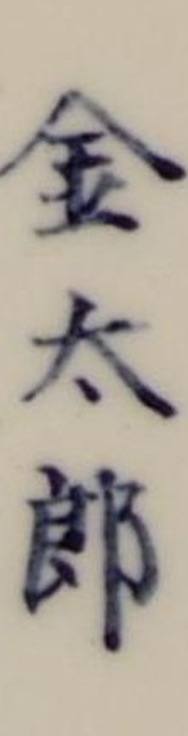金太郎
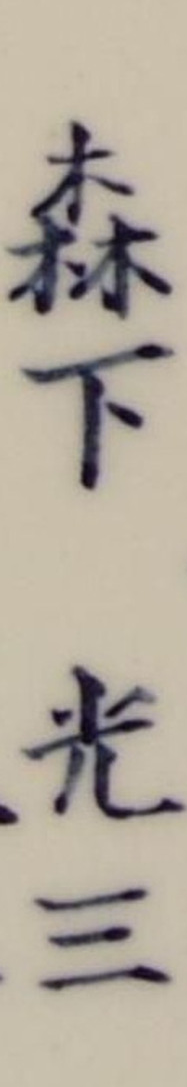森下光三
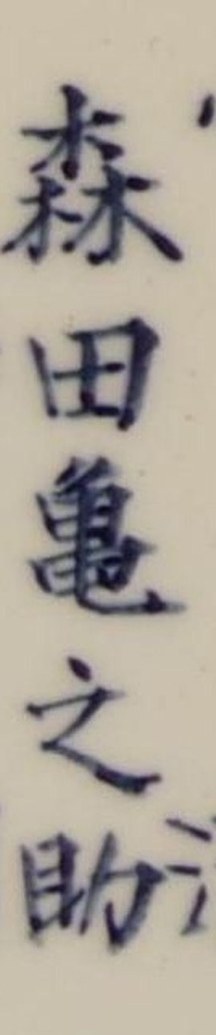森田亀之助
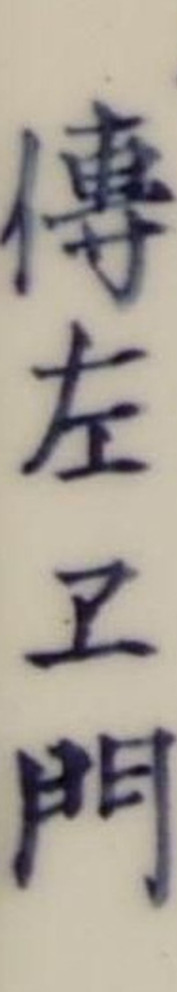傳左ヱ門

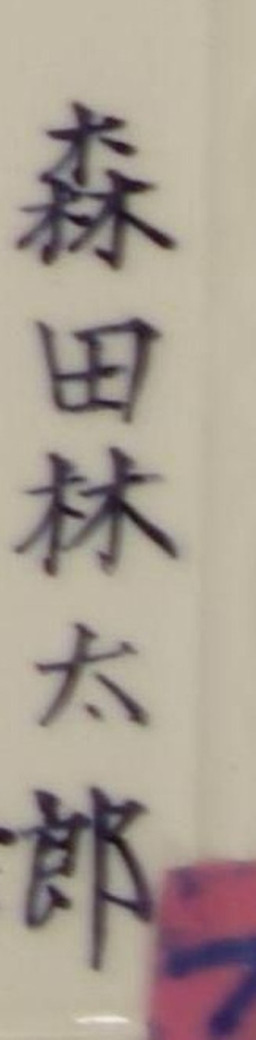森田林太郎
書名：E~L
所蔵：高野山金剛峯寺
